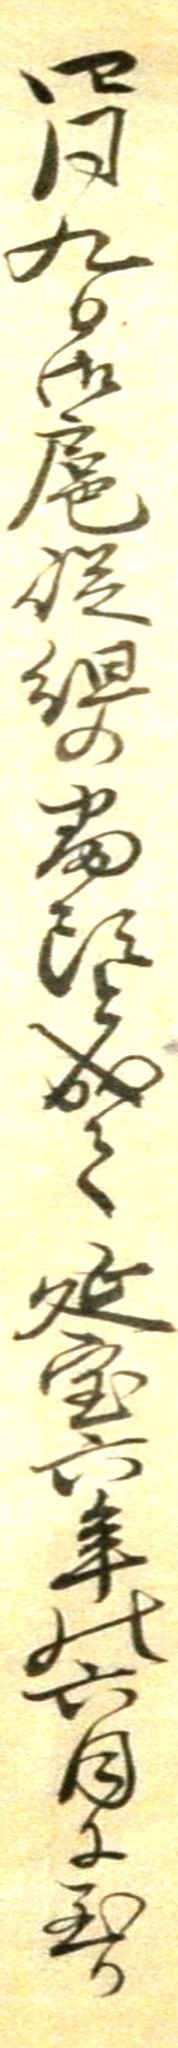四月九日御扈従組の番頭と成て延宝六年の六月に至り
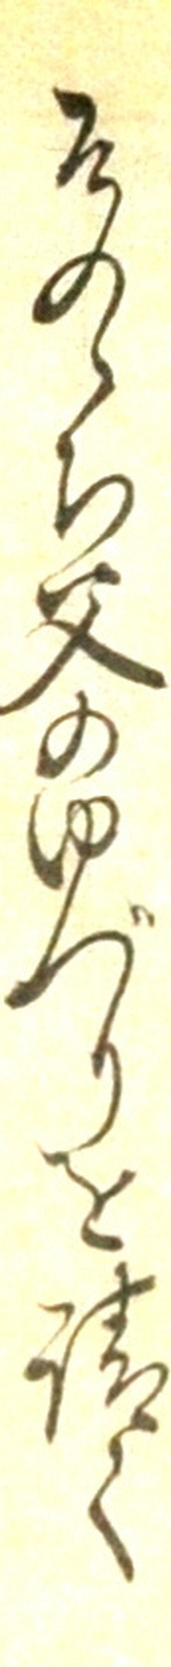そのゝち父のゆづりを請く
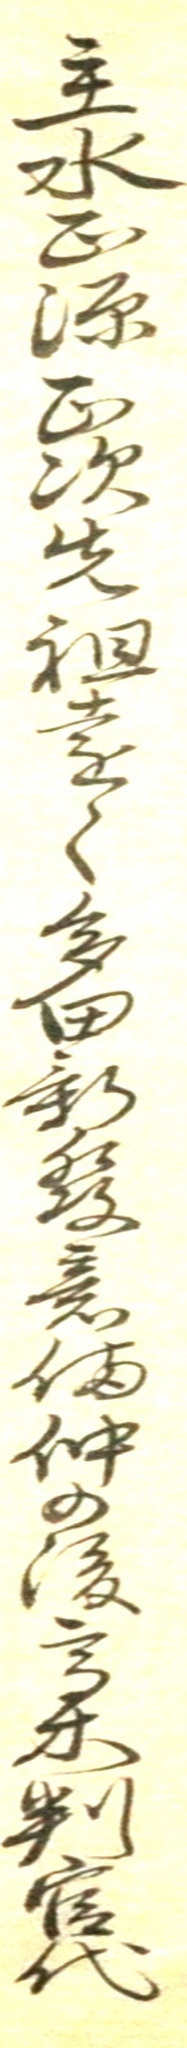主水正源正次先祖遠く只多田新発意満仲の後高木判官代
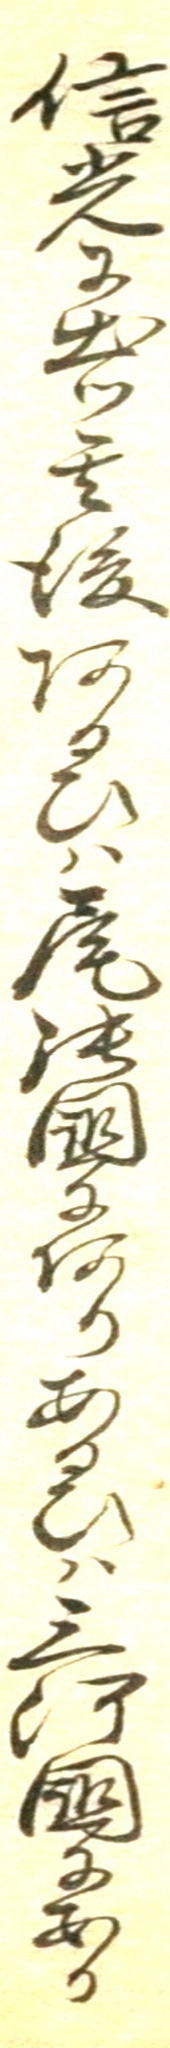信光に出ッ其後あるひは尾張国にありあるひは三河国にある
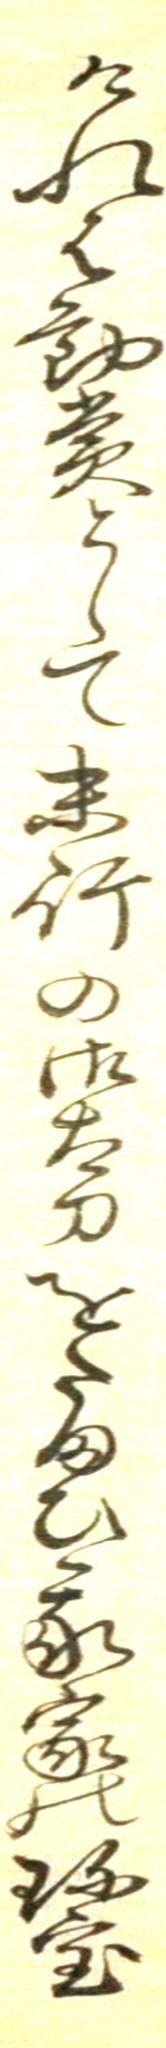けれは勧賞として末行の御太刀をたまひ我家の珍宝
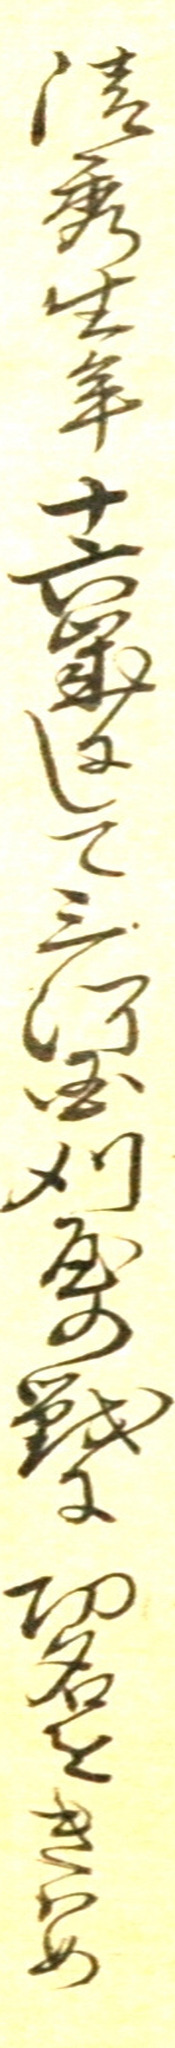清秀生年十六歳にして三河国刈屋の戦に功名をきはめ

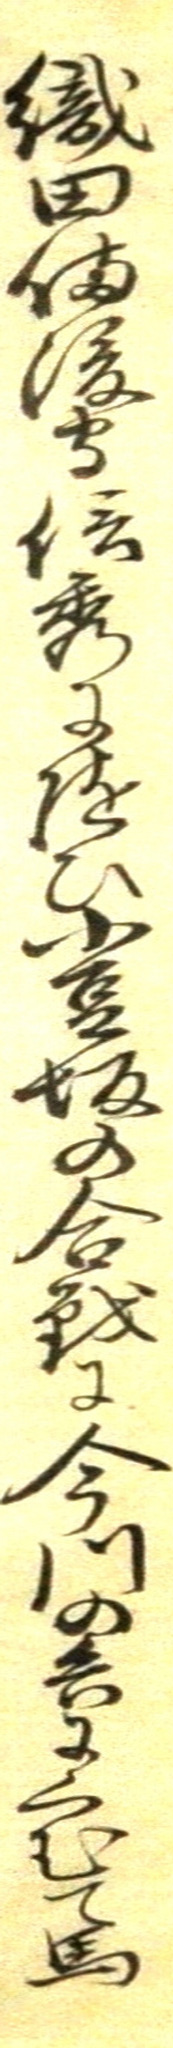織田備後守信秀に随ひ小豆坂の合戦に今川の兵にくむて馬
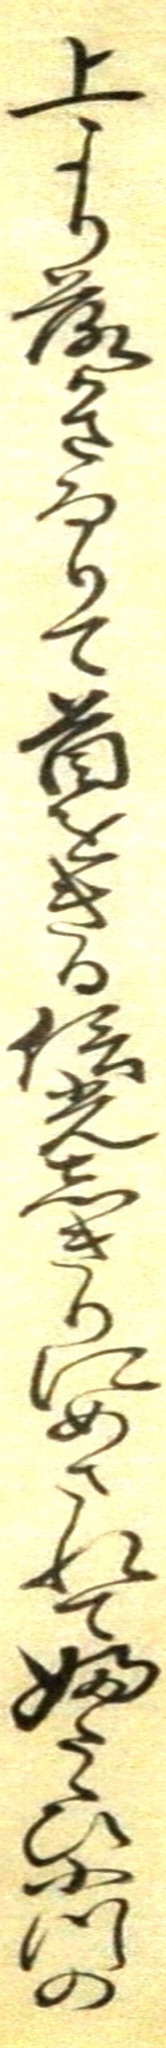上より落かさなりて首をきる信光しきりにめされてふたゝひ小川の
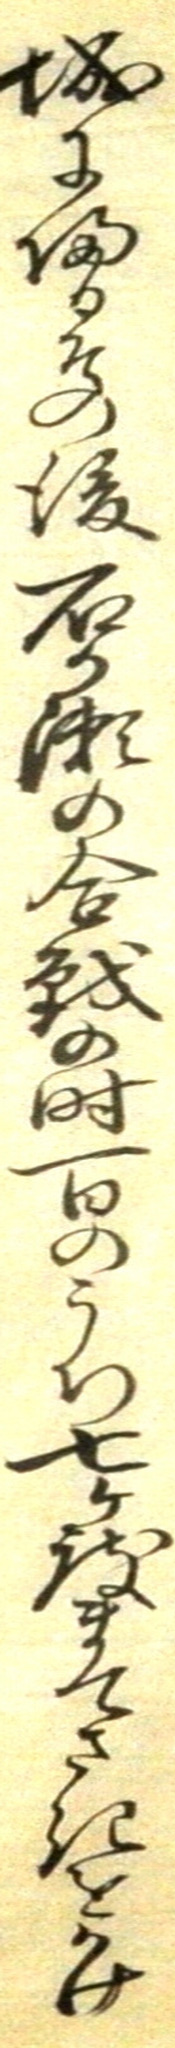城に帰るその後石か瀬の合戦の時一日のうち七ヶ度まてさきをかけ
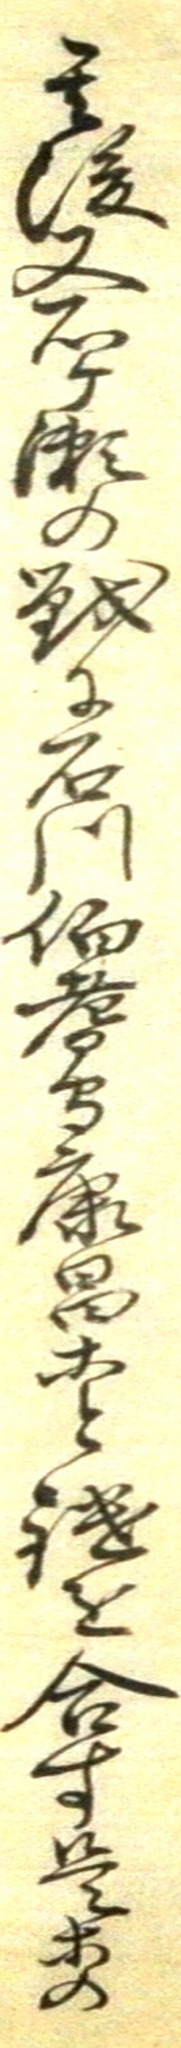其後又石ヶ瀬の戦に石川伯耆守康昌等と鑓を合す是等の
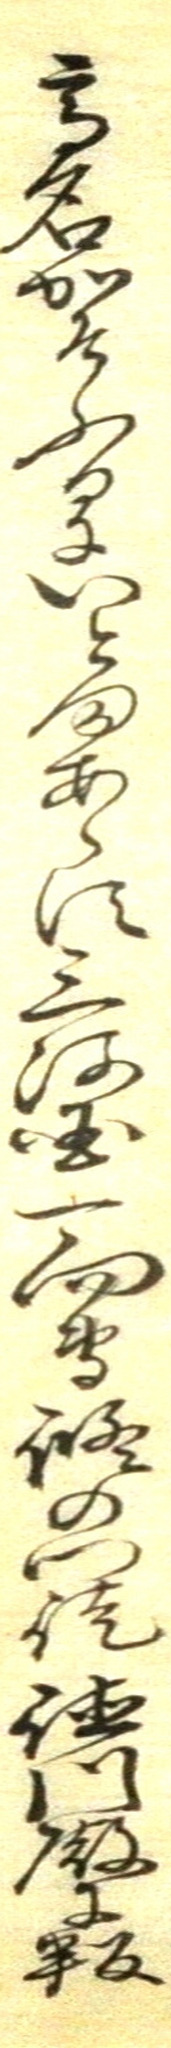高名かそふるにいとまあらす三河国一向専修の門徒徳川殿に叛
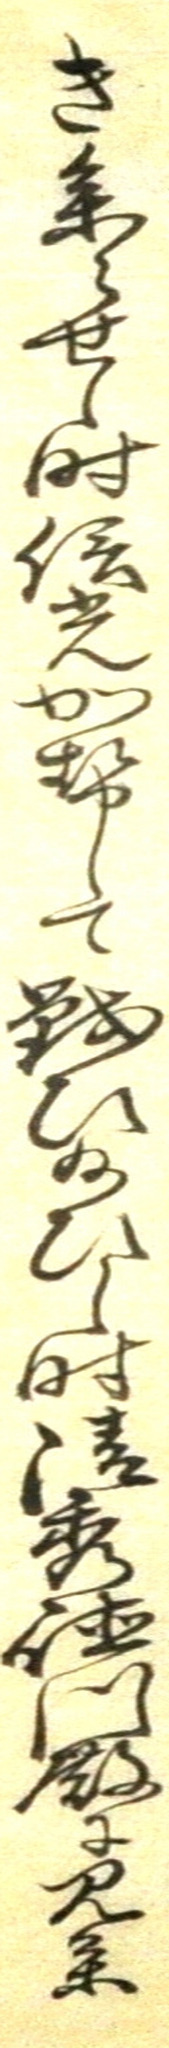き参らせし時信光加勢して戦ひ給ひし時清秀徳川殿に見参
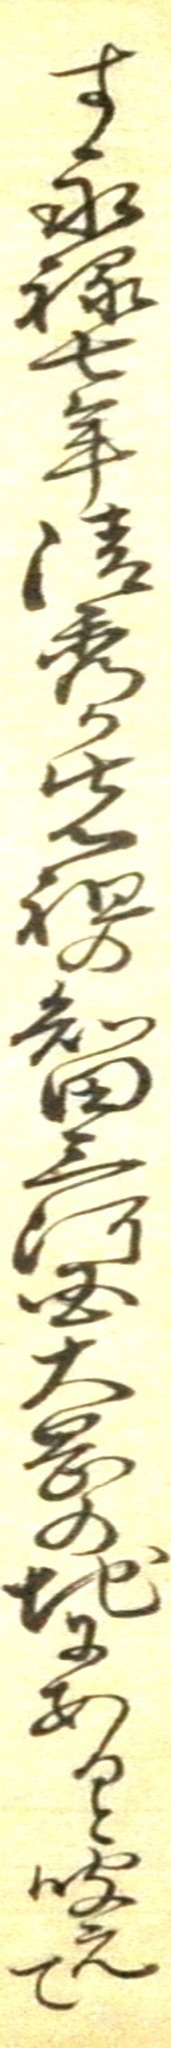す永禄七年清秀か先祖の知田三河国大岡の地にあると聞えて
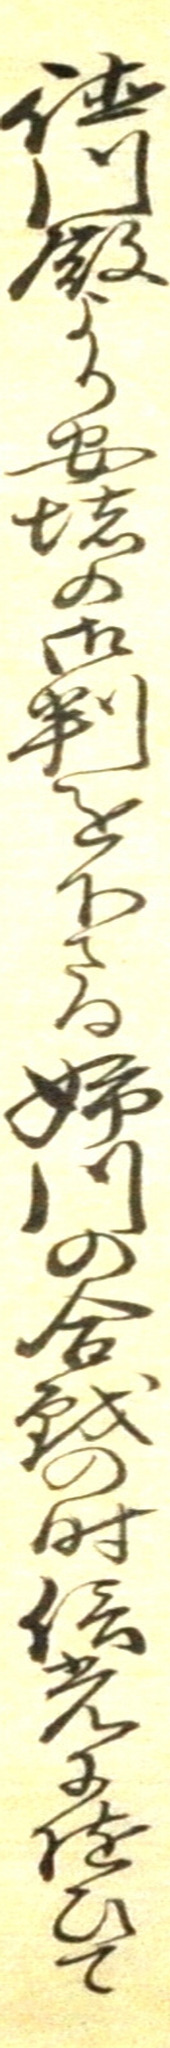徳川殿より安堵の御判を下さる姉川の合戦の時信光に随ひて
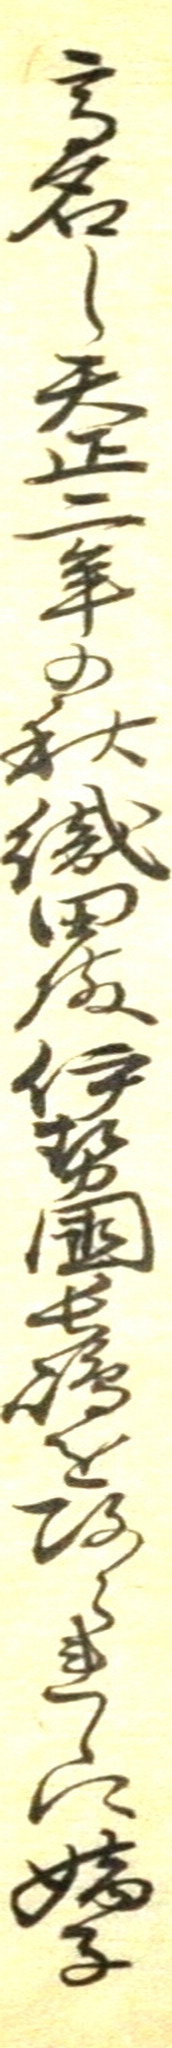高名し天正二年の秋織田殿伊勢国長島を攻られしに嫡子
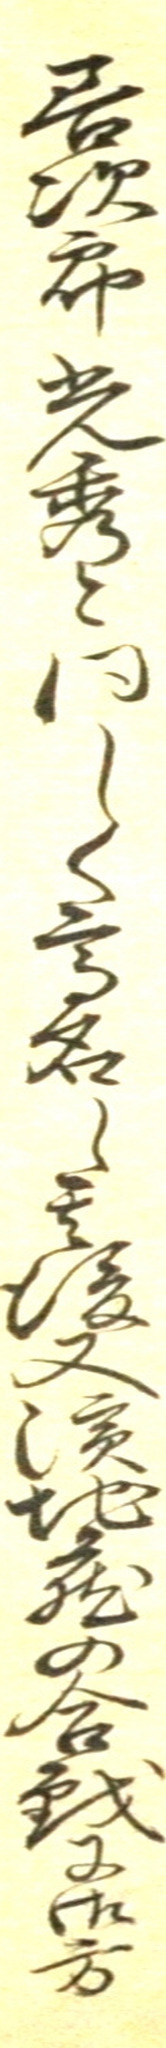善次郎光秀と同しく高名し其後又浜地蔵の合戦に御方
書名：藩翰譜（四・下）
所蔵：伊那市立高遠町図書館・合同会社AMANE
